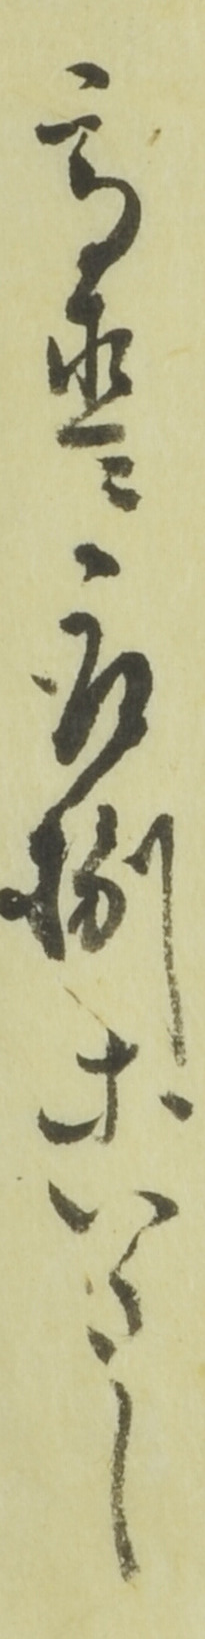高直ニ取捌等いたし
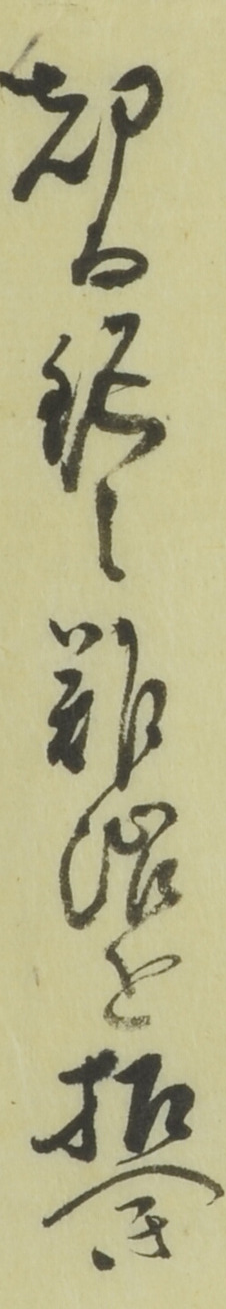却而銘々難渋を招へき
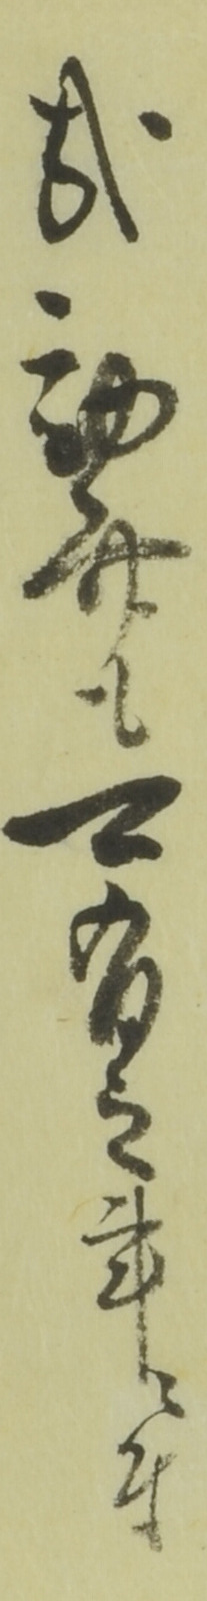哉勘弁も可有之事ニ付
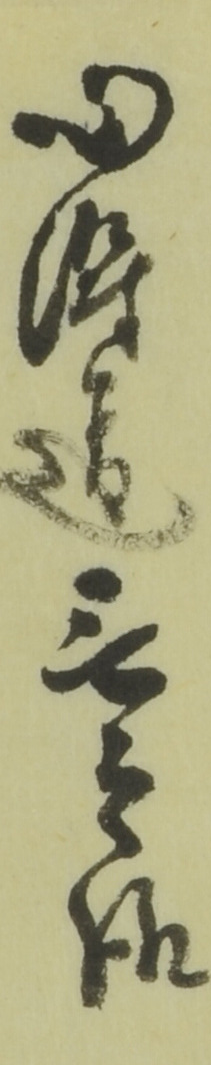心得違無之様
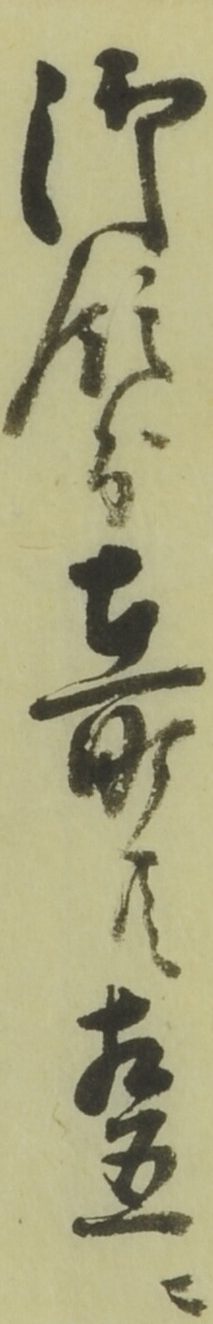御領分在町共相互ニ

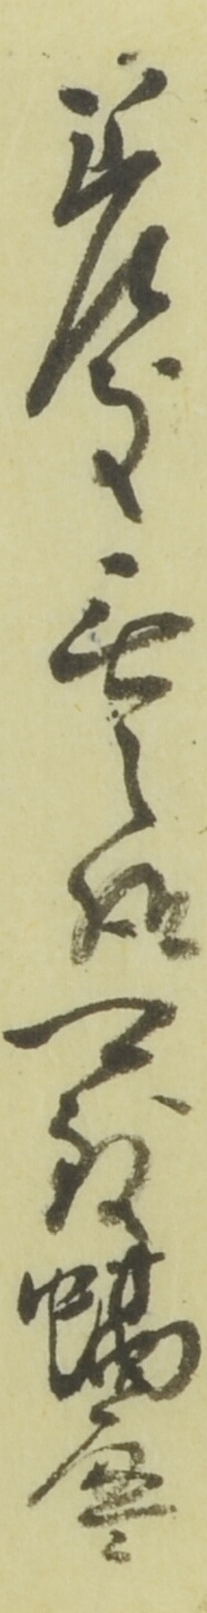差支無之様可致融通ニ
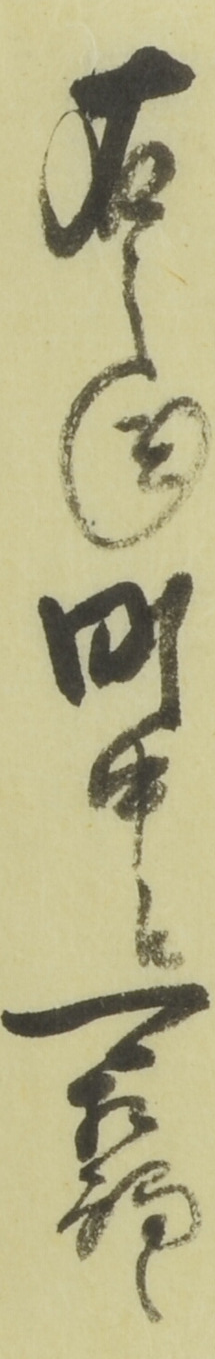右之趣町中江可相触候
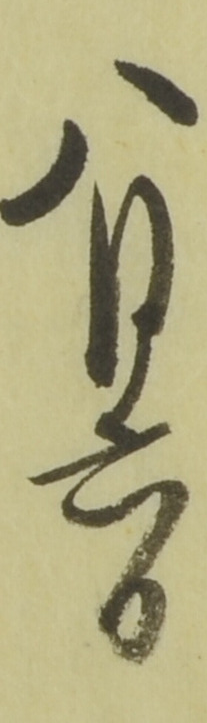八月六日
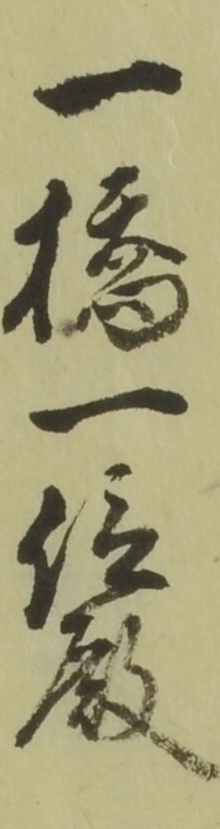一橋一位殿
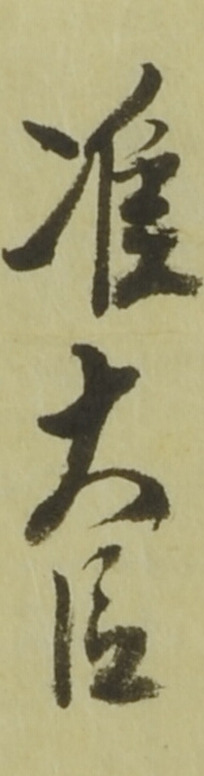准大臣
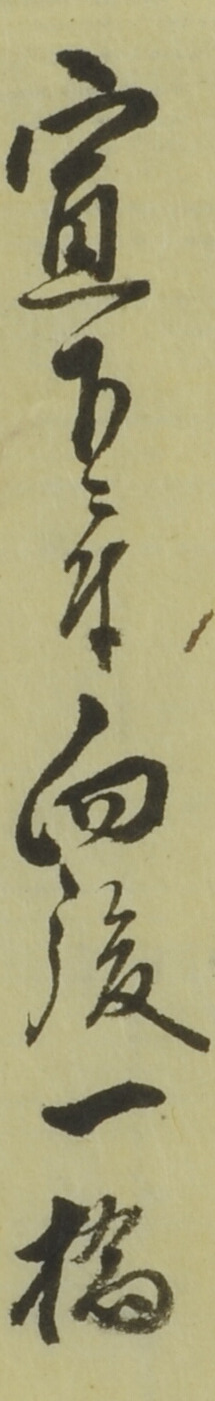宣下ニ付向後一橋
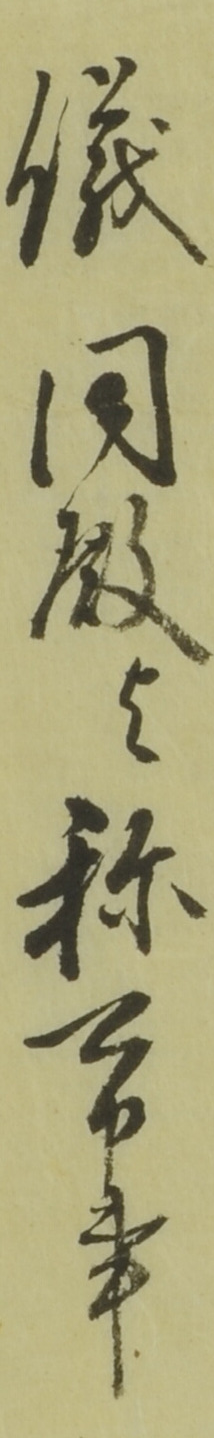儀同殿と称可申事
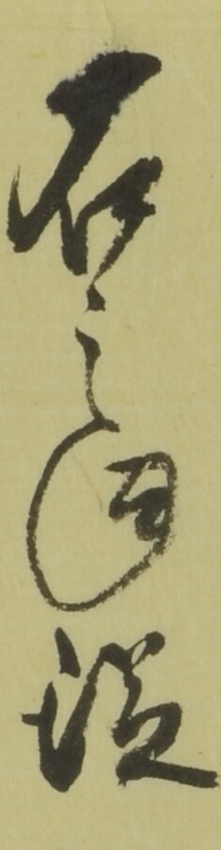右之趣従
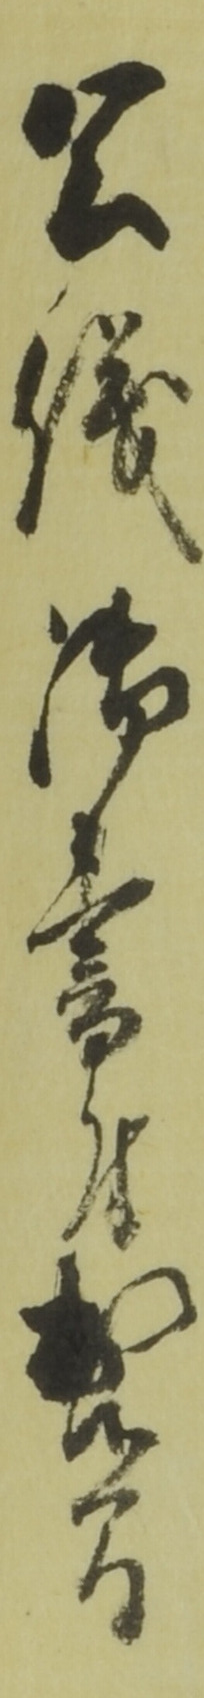公儀御書付出候間
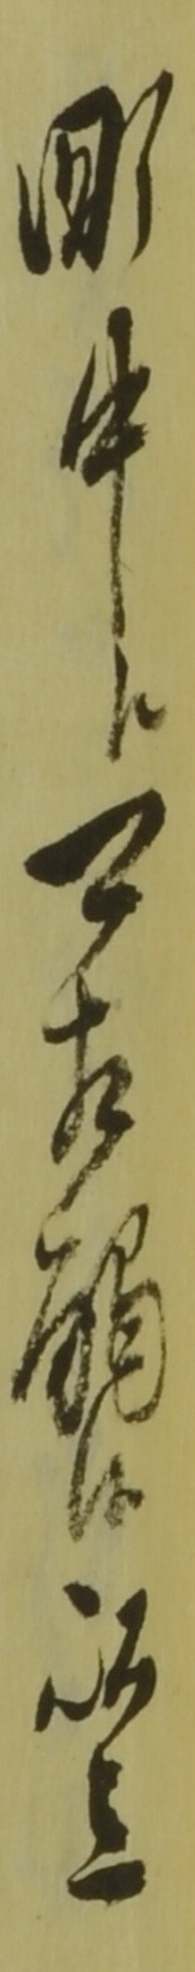町中江可相触候以上

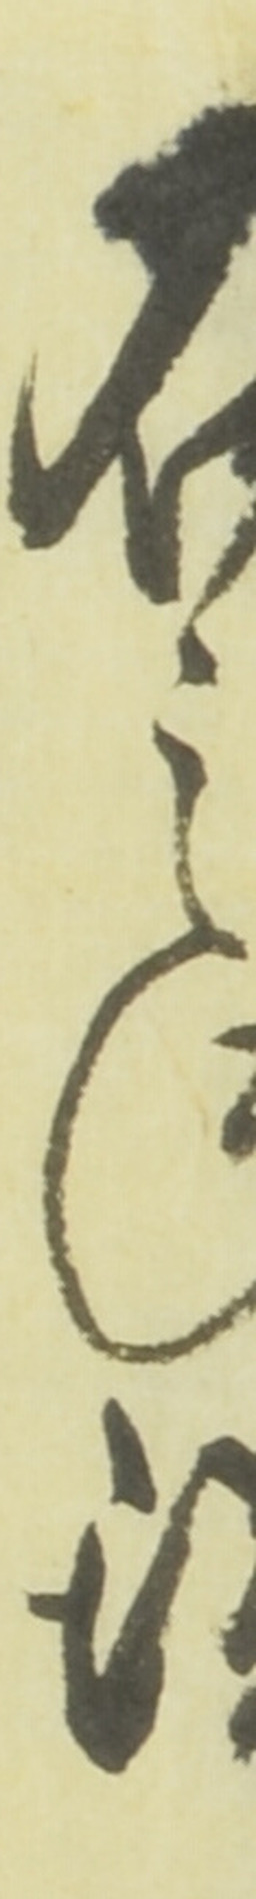右之趣従
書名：御触書御書附控
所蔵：伊那市立高遠町図書館・合同会社AMANE
